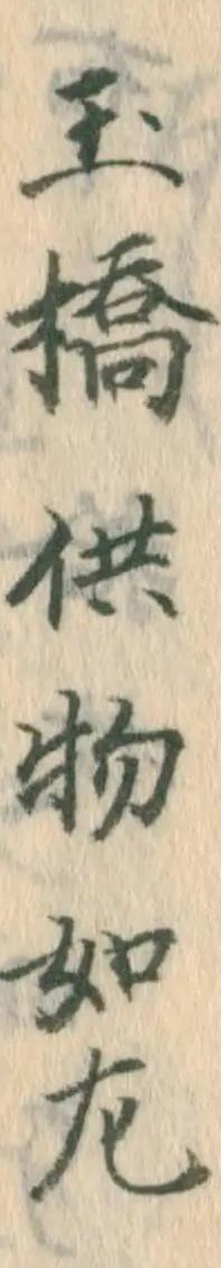玉橋供物如左
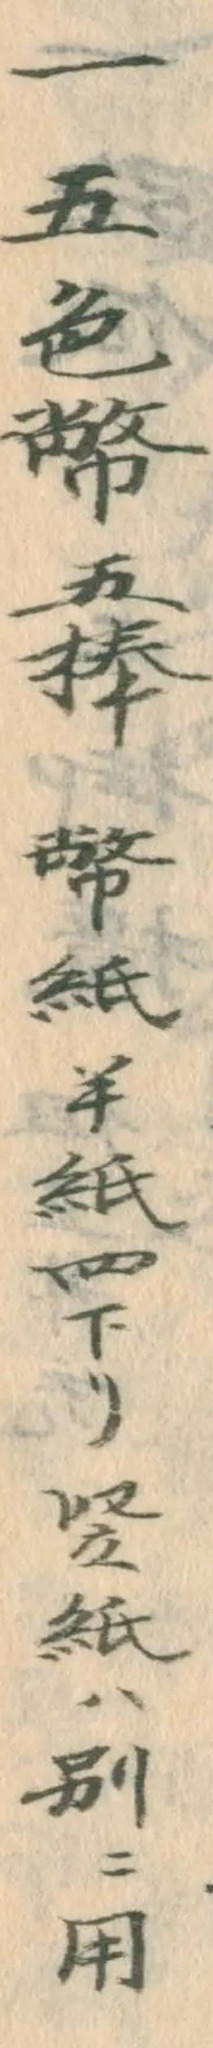一五色幣五捧幣紙半紙四下リ竪紙ハ別ニ用

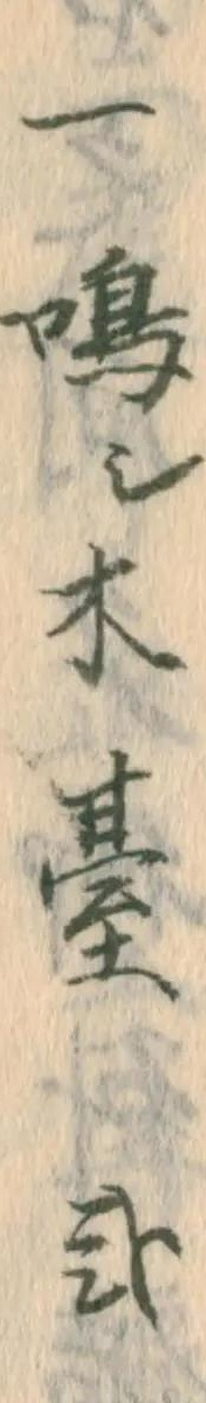一鳴シ木台弐
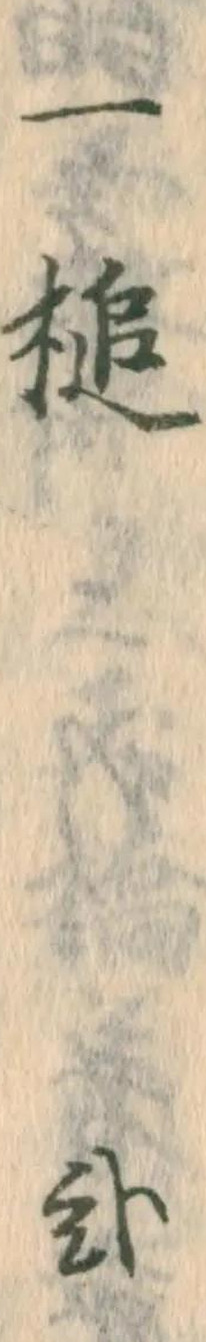一槌弐
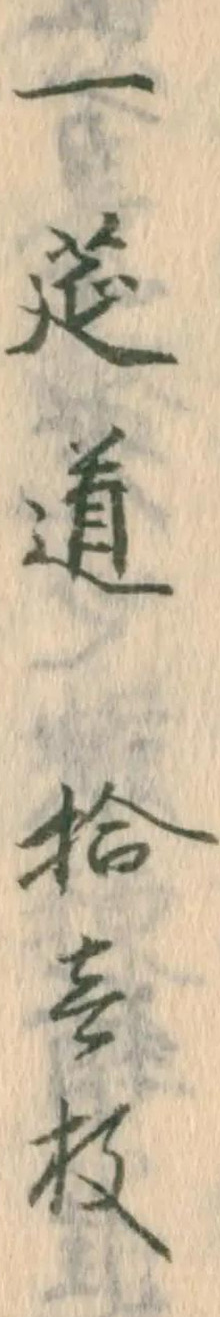一筵道拾壱枚
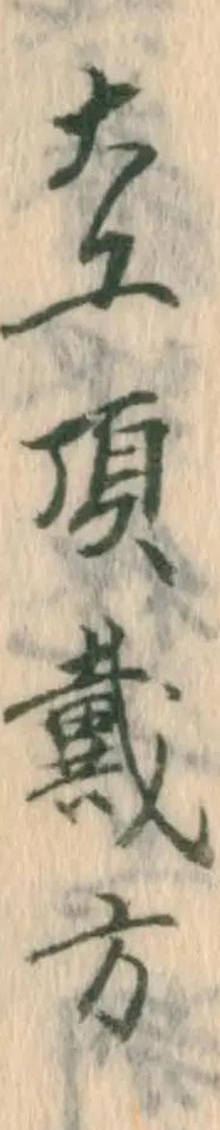大工頂戴方
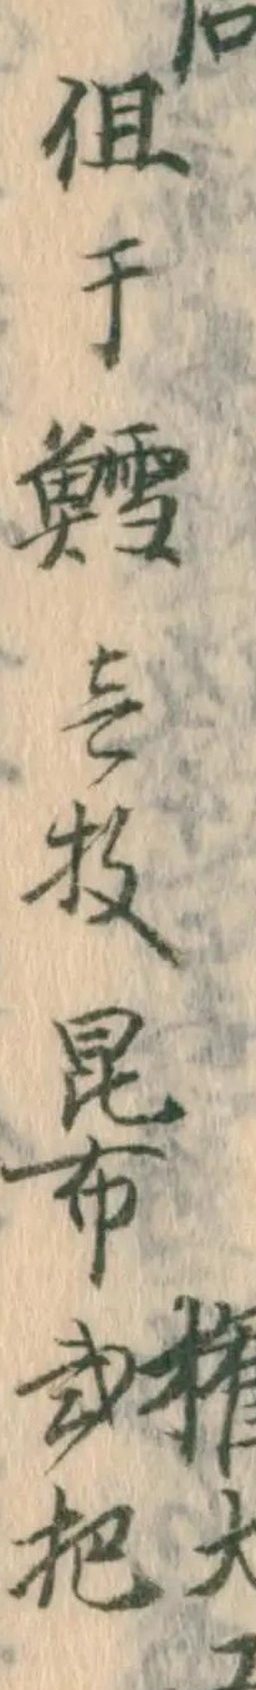但干鱈壱枚昆布弐把
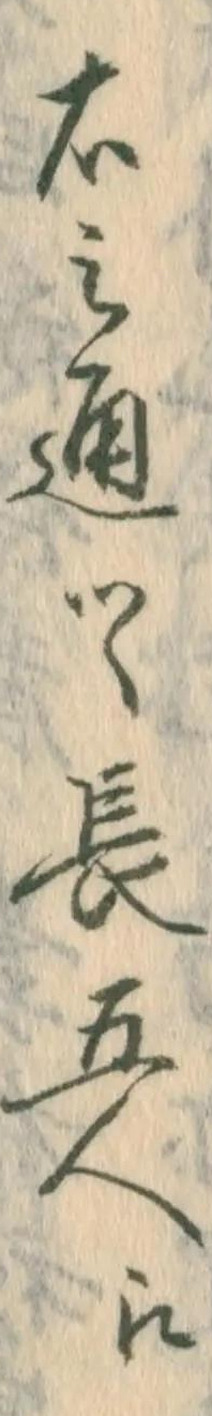右之通ツヽ長五人江
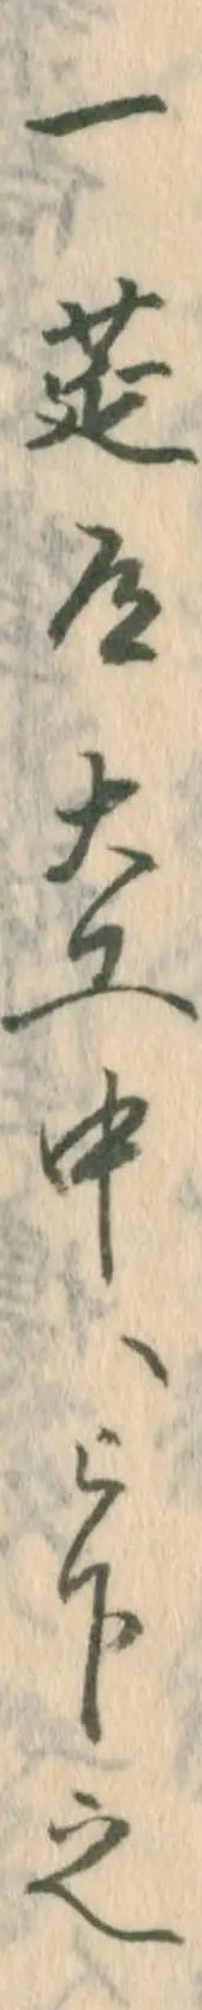一筵道大工中へ被下之

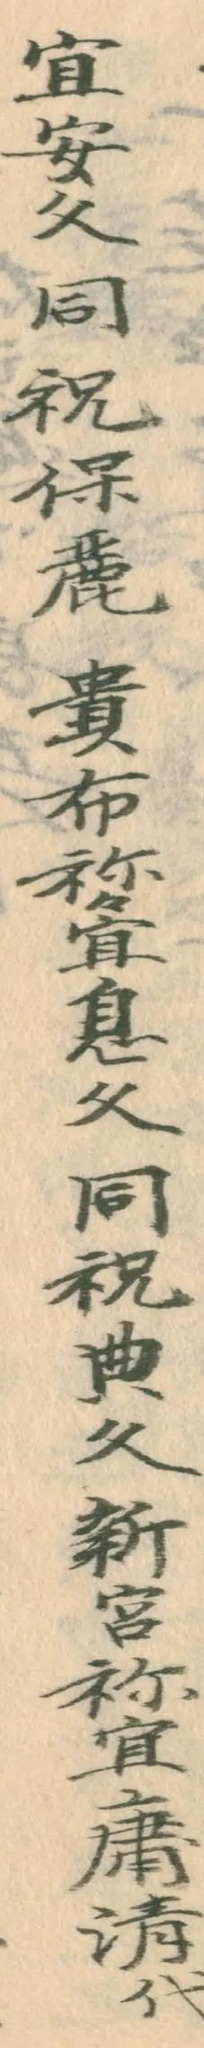宣安久同祝保麗貴布祢々宜息久同祝典久新宮祢宜庸清代
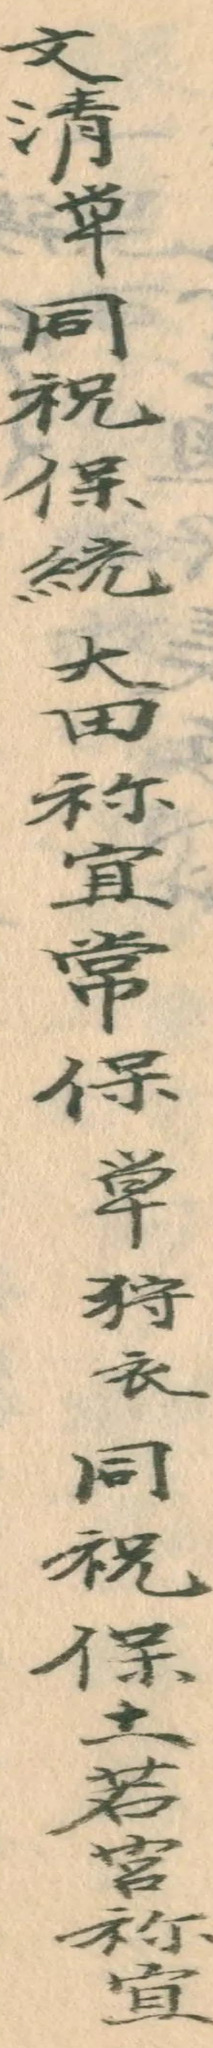文清単同祝保統大田祢宜常保単狩衣同祝保土若宮祢宜
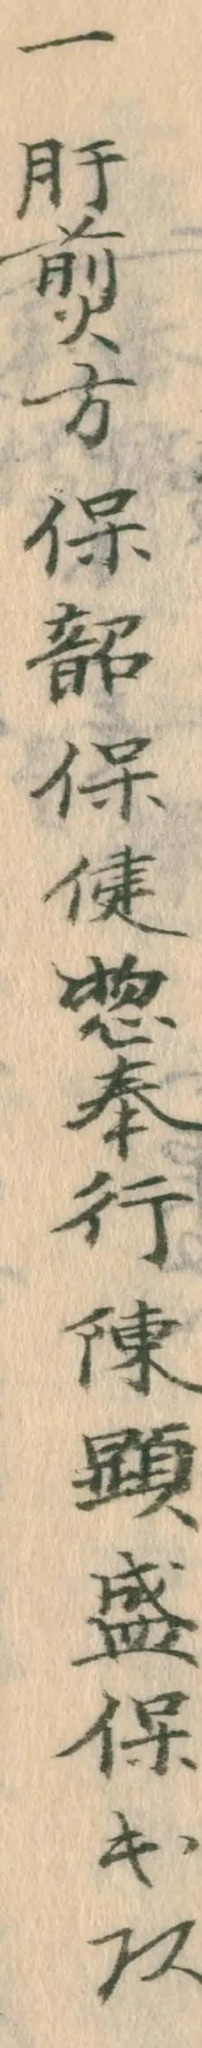一肝煎方保韶保健惣奉行陳顕盛保出頭
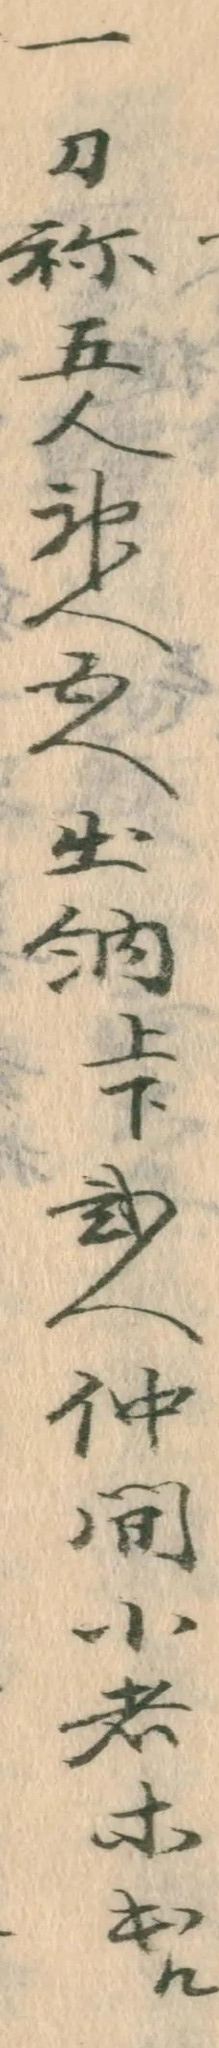一刀祢五人神人五人出納上下弐人仲間小者等出ル
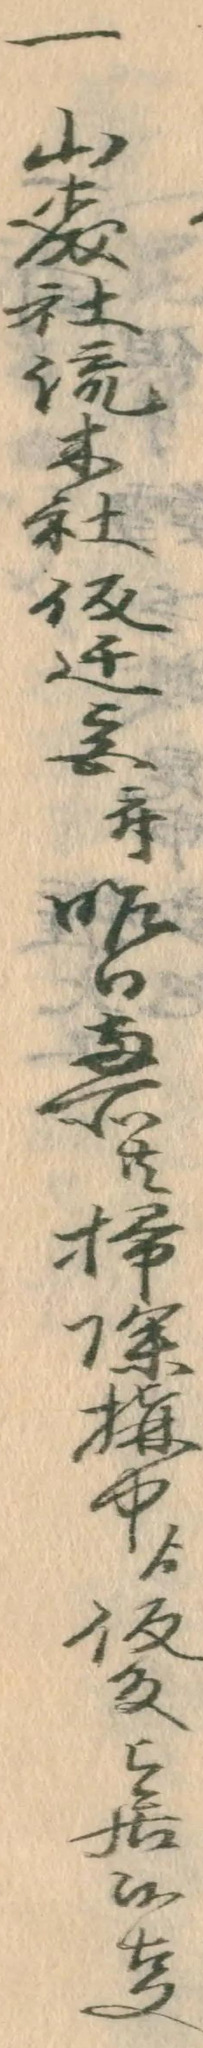一山森社流木社仮壱迁宮ニ付昨日両所共掃除構中ゟ仮殿被居候事
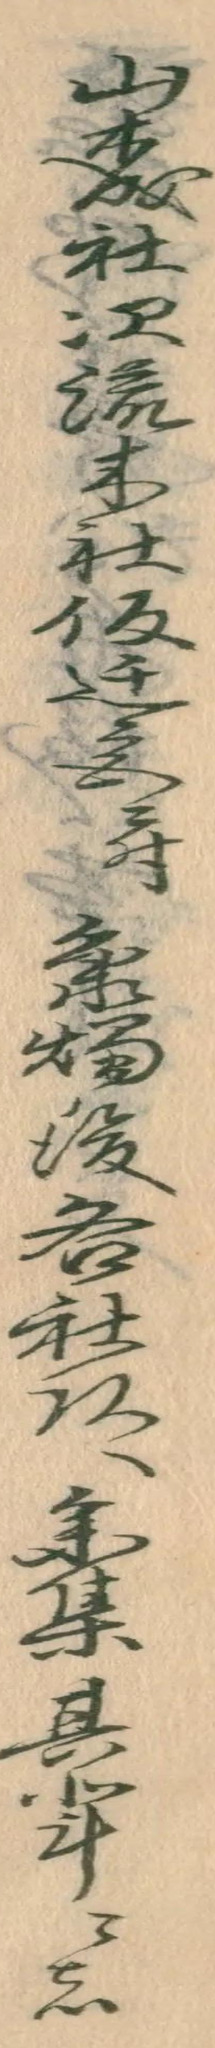一山森社次流木社仮迁宮ニ付秉燭後各社頭へ参集其輩ニは
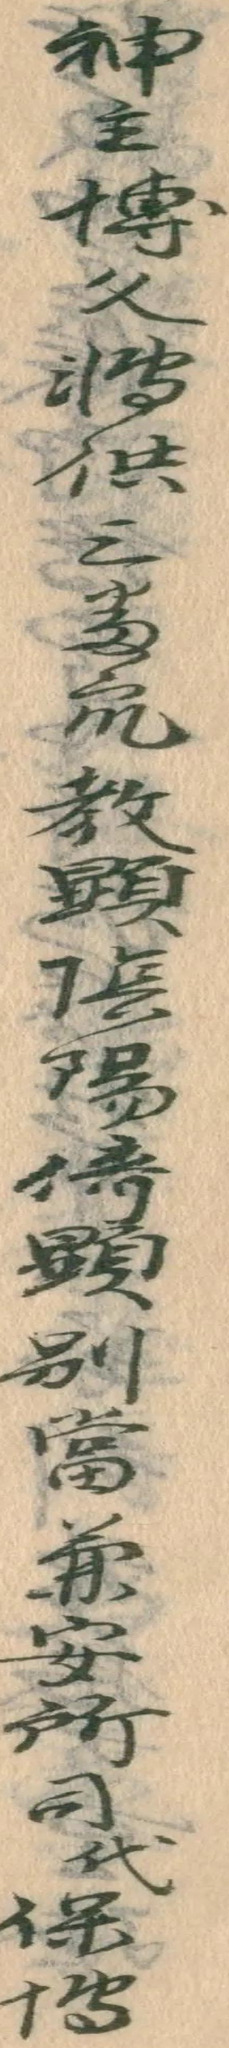神主博久転供三番衆教顕陰陽倚顕別当兼安所司代保博
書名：賀茂社記録. 第17冊
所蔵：国立国会図書館 National Diet Library, JAPAN
